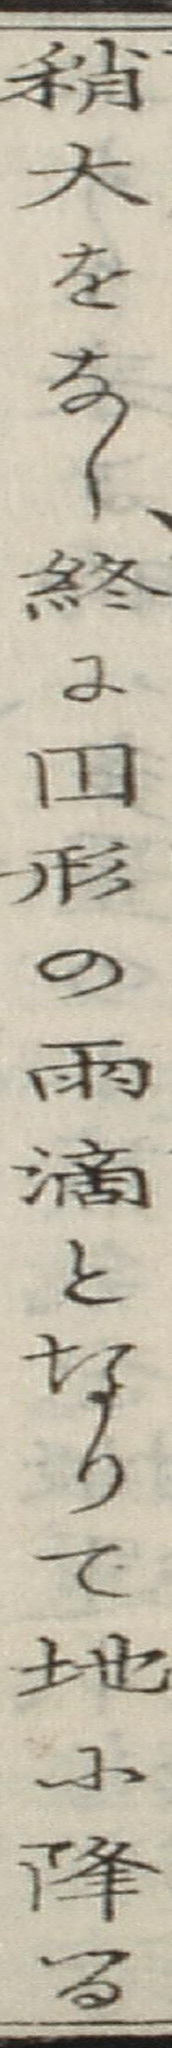稍大をなし、終に円形の雨滴となりて地に降る
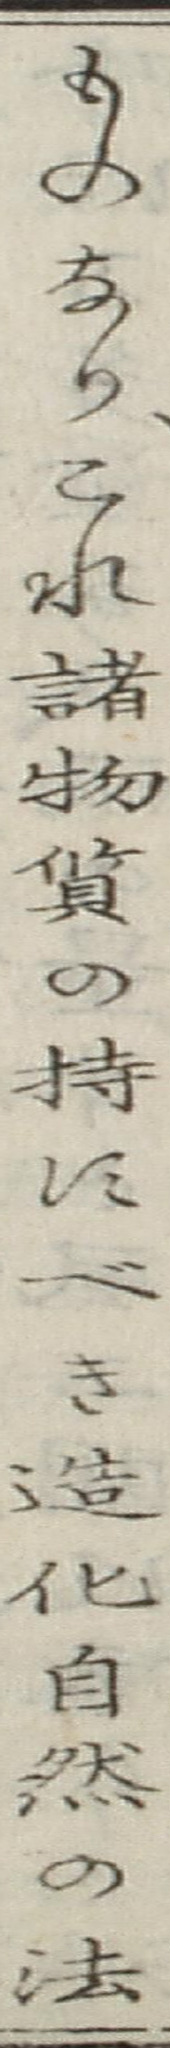ものなり、これ諸物質の持すべき造化自然の法
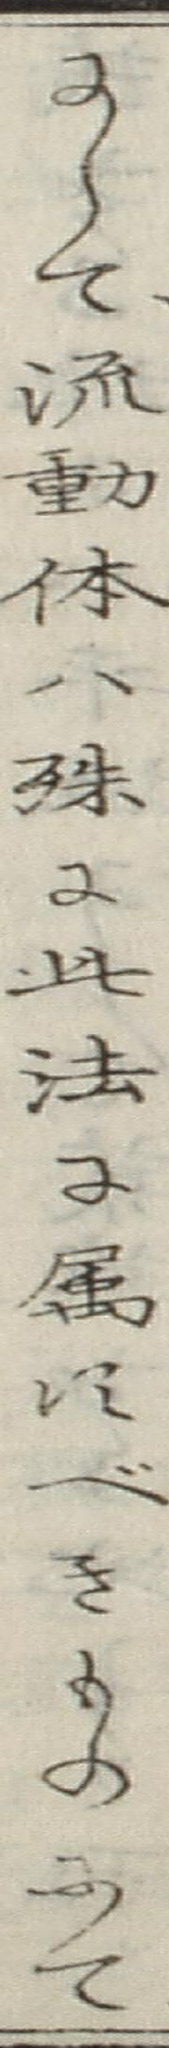にして、流動体は殊に此法に属すべきものにて、
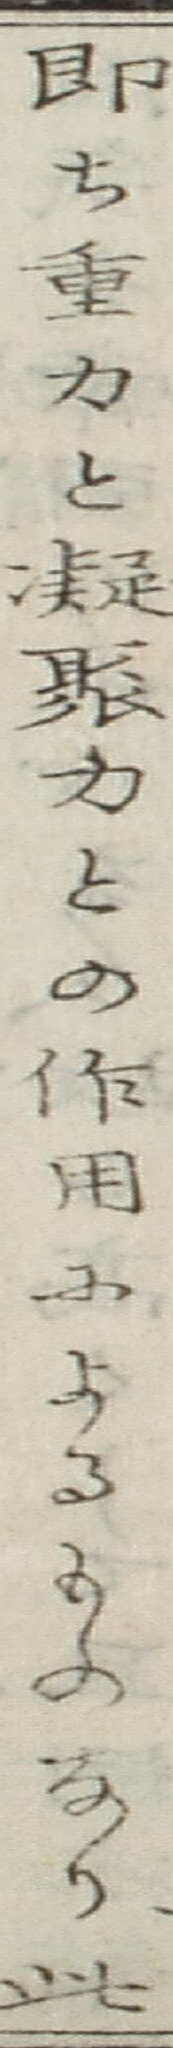即ち重力と凝聚力との作用によるものなり、此
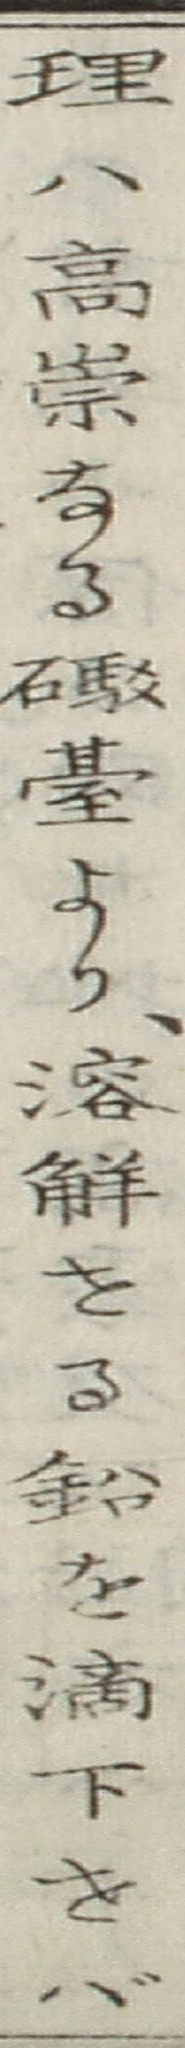理は高崇なる砲台より、溶解せる鉛を滴下せば
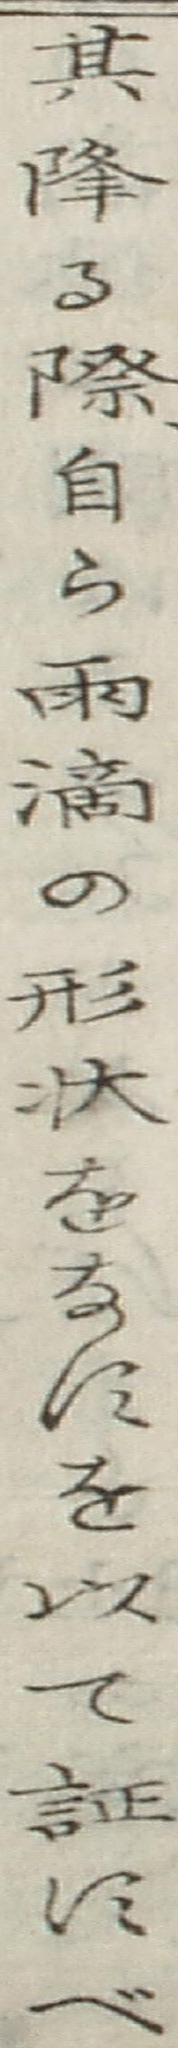其降る際、自ら雨滴の形状をなすを以て証すべ
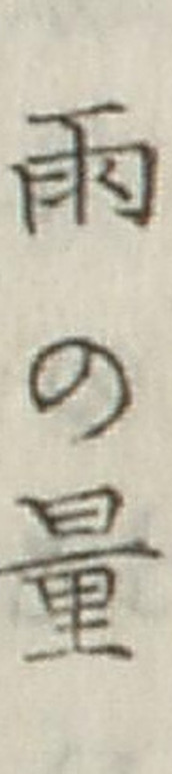雨の量
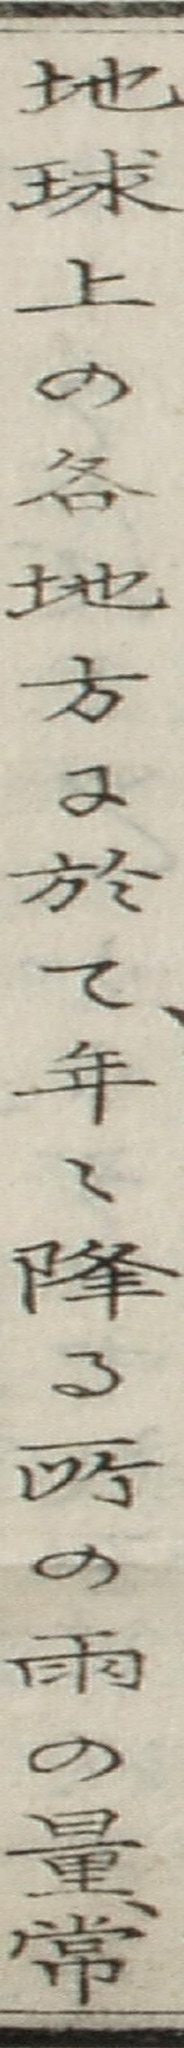地球上の各地方に於て、年々降る所の雨の量、常

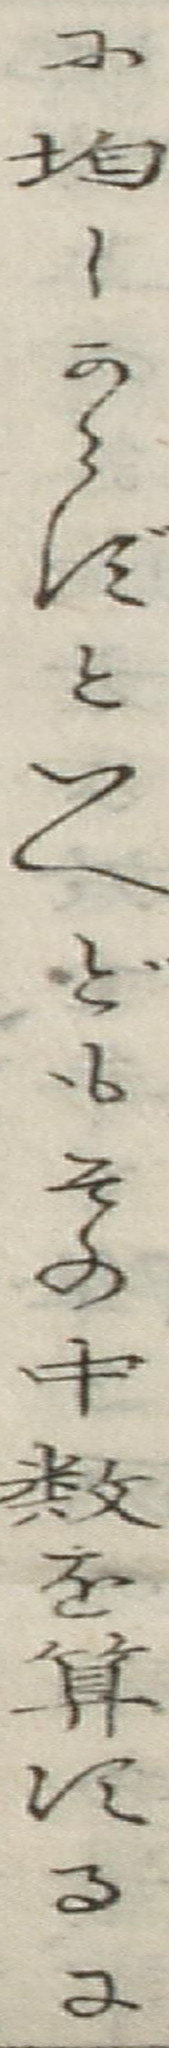に均しからずといへども、その中数を算するに、
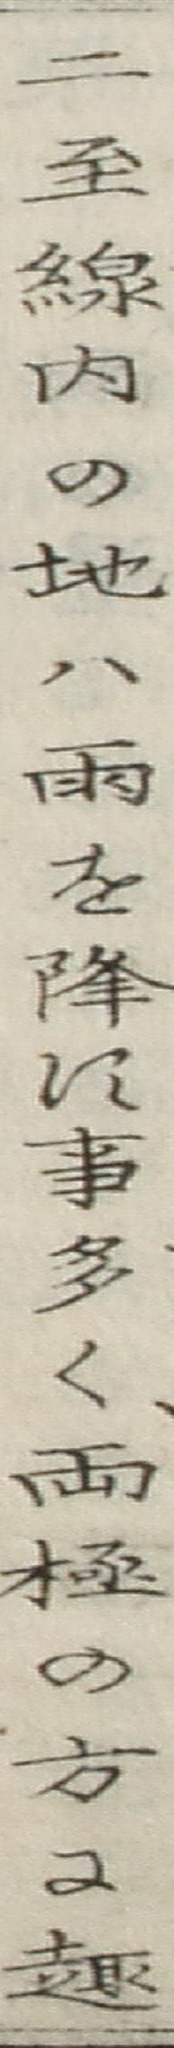二至線内の地は雨を降す事多く、両極の方に趣
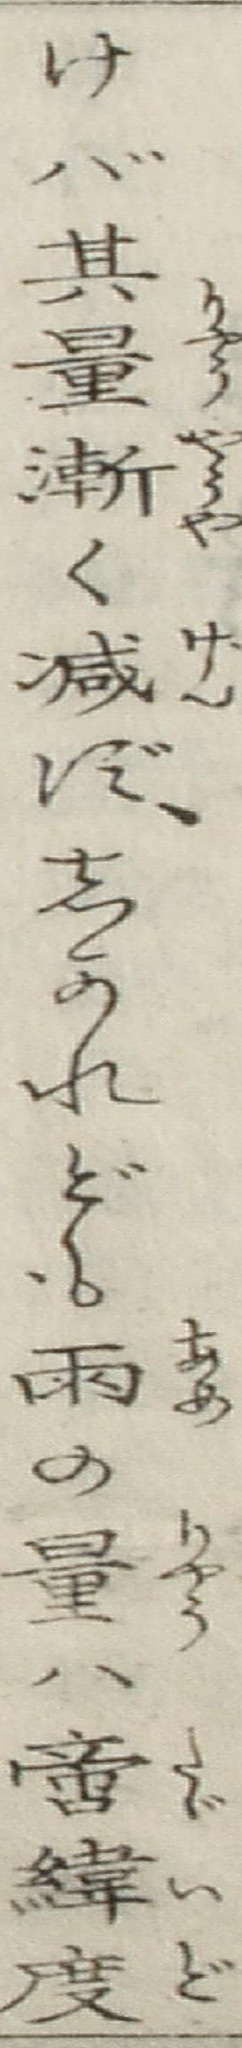けば其量漸く減ず、しかれども雨の量は啻緯度
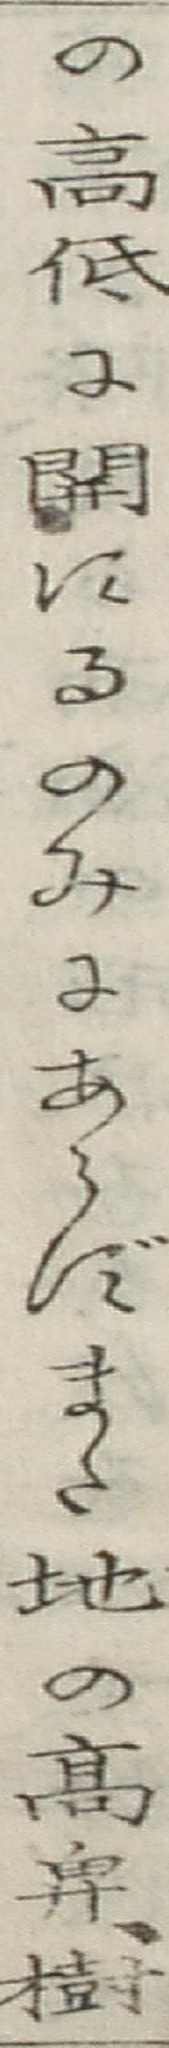の高低に関するのみにあらず、また地の高卑、樹
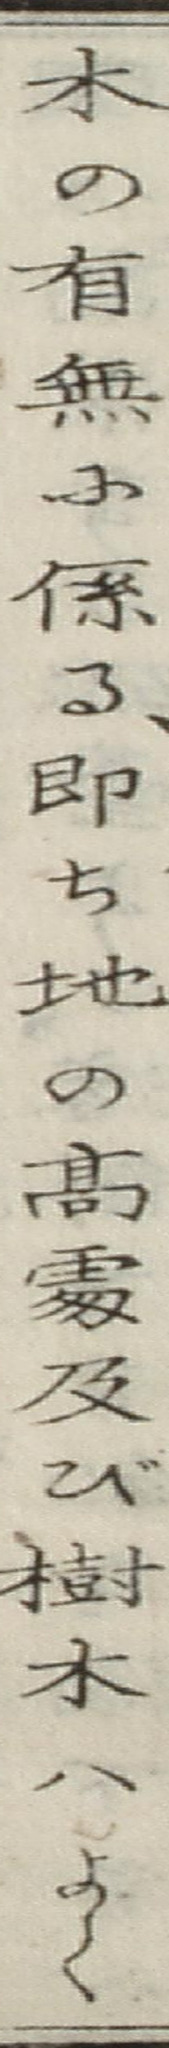木の有無に係る、即ち地の高処及び樹木はよく
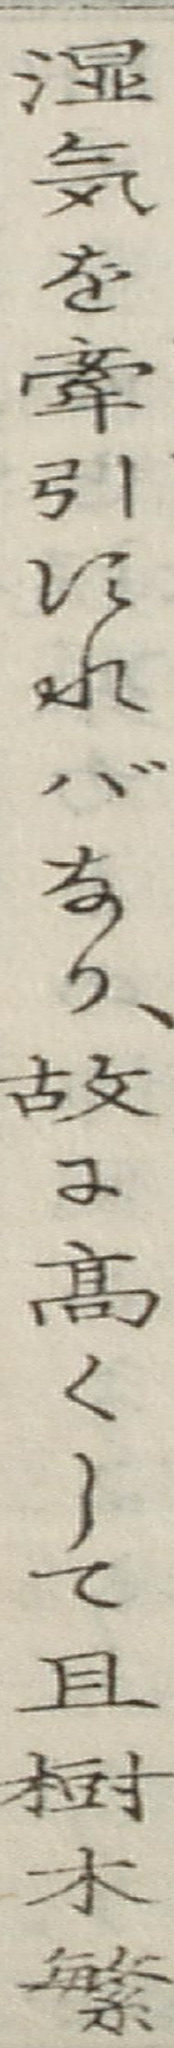湿気を牽引すればなり、故に高くして且樹木繁
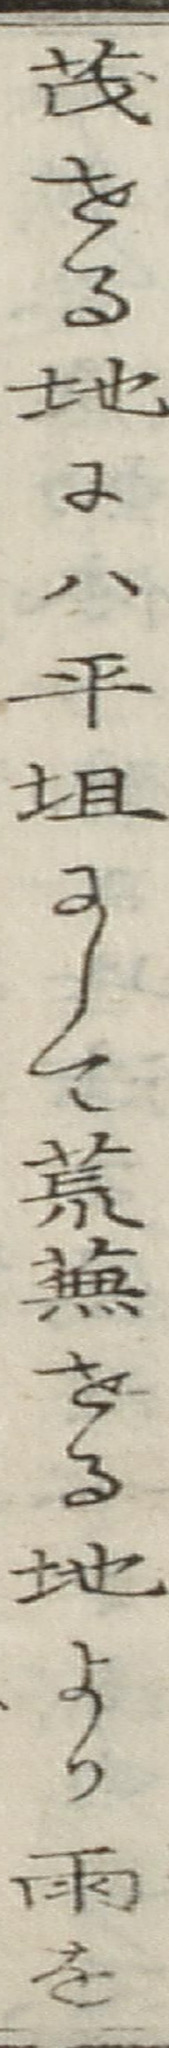茂せる地は、平坦にして荒蕪せる地より雨を
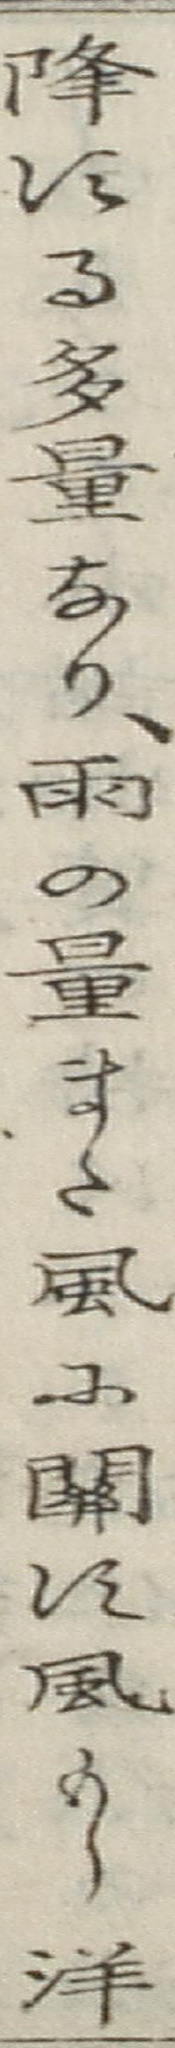降する多量なり、雨の量また風に関す、風もし洋
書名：訓蒙　天然地理學　下
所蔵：東京大学地震研究所図書室 Earthquake Research Institute Library, The University of Tokyo, JAPAN
